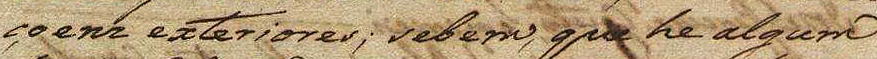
çoenz exteriores; se bem, que he algum
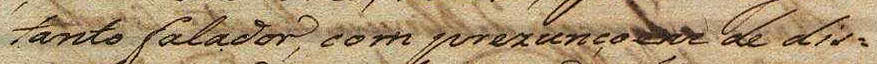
tanto falador, com prezunçoenz de dis
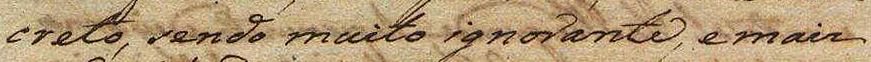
creto, sendo muito ignorante, e maiz
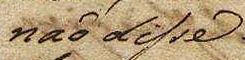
naõ disse
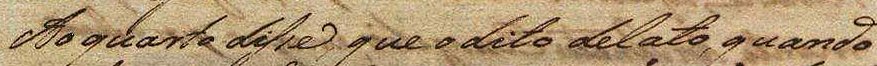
Ao quarto disse, que o dito delato, quando
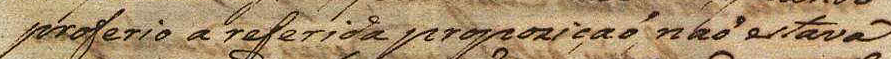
proferio a referida propoziçaõ naõ estava
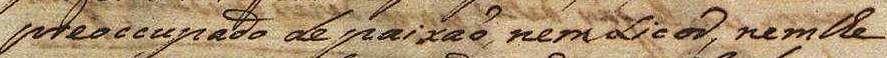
preoccupado de paixaõ, nem Licor, nem lhe
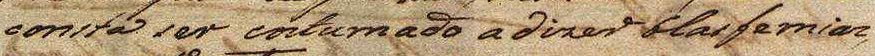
consta ser costumado a dizer blasfemiaz,
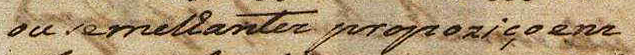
ou semelhantes propoziçoenz
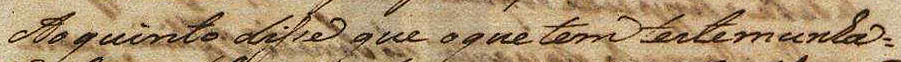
Ao quinto disse que o que tem testemunha
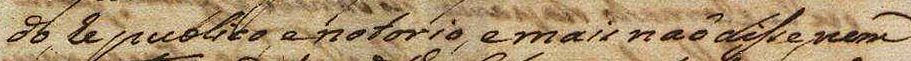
do he publico, e notorio, e mais naõ disse, nem
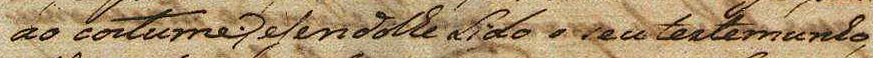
ao coztume; sendolhe Lido o seu testemunho,
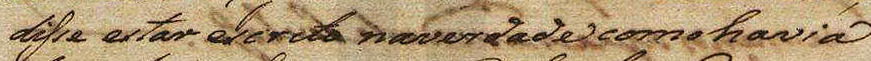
disse estar escrito na verdade como havia
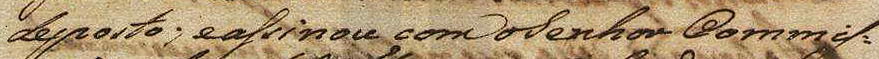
deposto; e assinou com o Senhor Commis
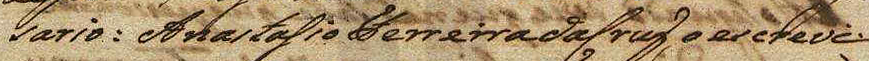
sario: Anastasio Ferreira da Cruz, o escrevi
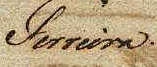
Ferreira.
